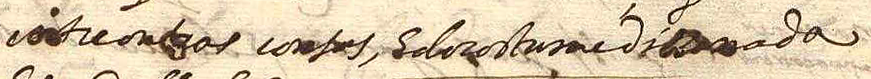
entre outras cousas, E do costume di__nada
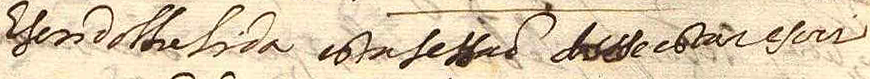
E sendolhe lida esta sessaõ disse estar escri
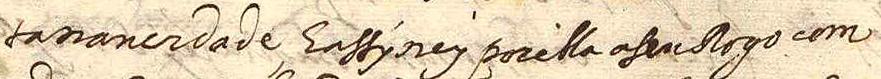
ta na uerdade, E assyney por ella a seo Rogo com
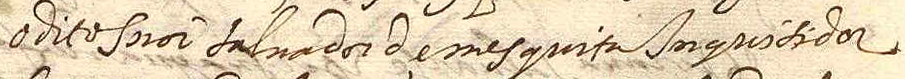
o dito snor̄ saluador de mesquita Inquisidor
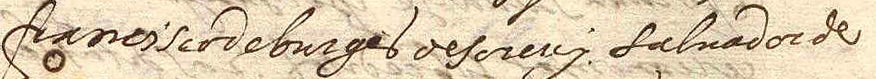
francisco de burges o escreuy. saluador de
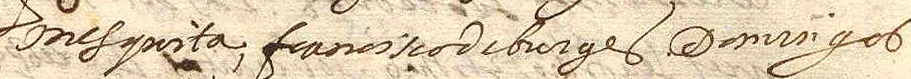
mesquita, francisco de burges. Domingos
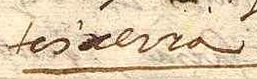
teixeira
